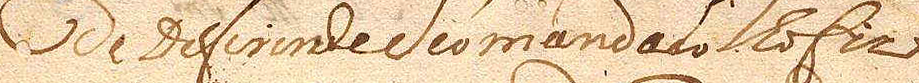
de Defirinde Seo mandado lho fiz
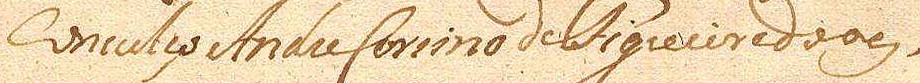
Concluço Andre Corsino de Figueiredo o es
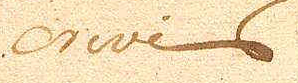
crevi
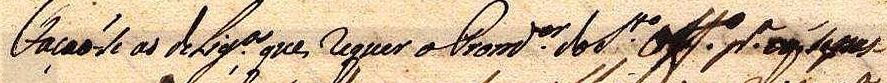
Façaõ-se as diLig;a que requer o Prom.tor do S.to Off.o p.a o q̄ se pas
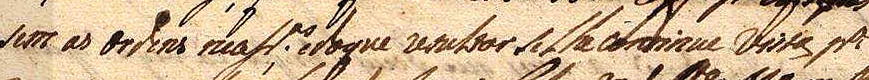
sem as ordens necesr;as do que rezultar se lha continue vista p.a
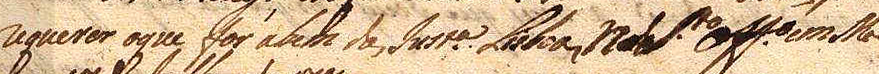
requerer o que for a bem da, Iust.a Lisboa, No S.to Off.o em Me
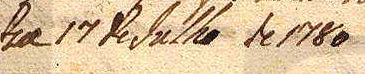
za 17 de Iulho de 1780
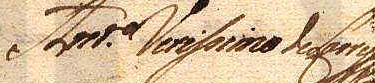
Ant.o Verissimo de Larre
